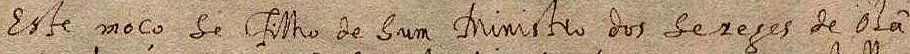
Este moço he filho de hum Ministro dos hereges de Olā
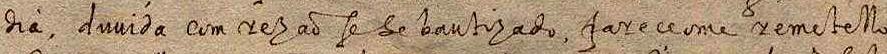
dia, duuida com rezāo se he bautizado, pareceome remetello
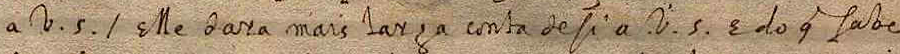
a v. s. / Elle dara mais largo conta de si a v. s. E do q̄ sabe
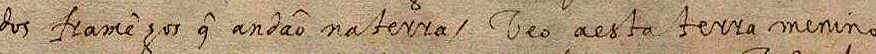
dos framēgos q̄ andaõ na terra / Veo a esta terra menino
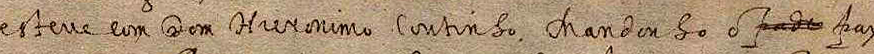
esteue com Dom Hieronimo Coutinho. Mandou ho o padre pay
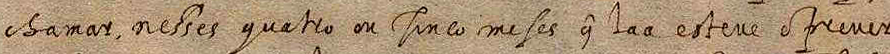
chamar, nesses quatro ou sinco meses q̄ laa esteue o preuer
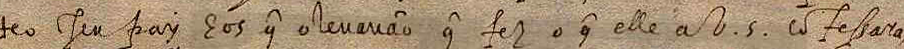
teo seu pay E os q̄ o leuauaõ q̄ fez o q̄ elle a v. s. cōfessara/
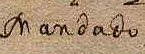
Mandado
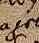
agora
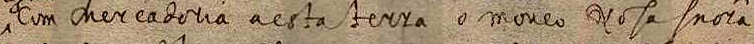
com Mercadoria a esta terra o moueo Nosa snorā
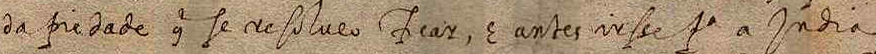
da piedade q̄ se resolueo ficar, E antes irsse pa a Jndia
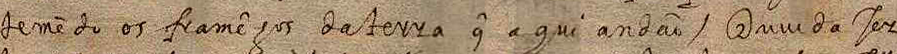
temēdo os framēgos da terra q̄ aqui andão / Duuida ser
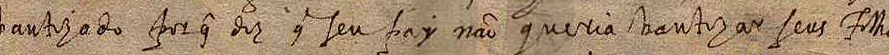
bautizado porq̄ diz q̄ seu pay naõ queria bautizar seus filhos
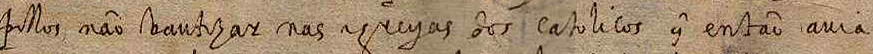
pollos não bautizar nas igreijas dos catolicos q̄ então auia
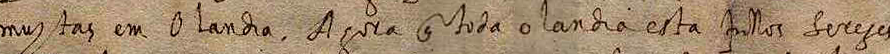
mujtas em Olandia, Agora q̄ toda olandia esta pollos hereges
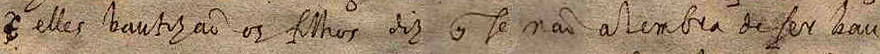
E elles bautizaõ os filhos diz q̄ se naõ alembra de ser bau
